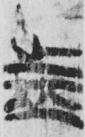者
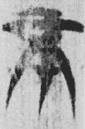不
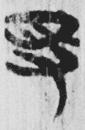○（得）
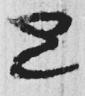已
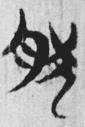肰（然）
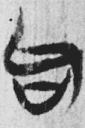句（後）
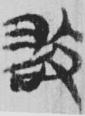敢
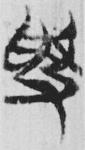受
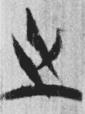之
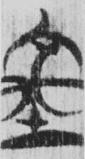○（禹）
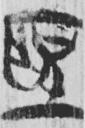聖（聽）
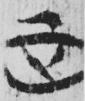正（政）
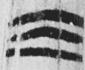三
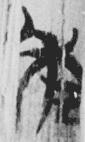年
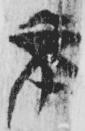不
